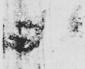君
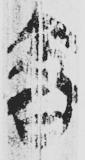客（格）
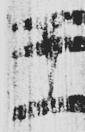王
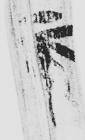天
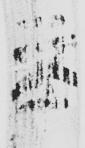不
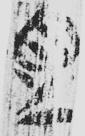見
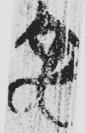禹（害）
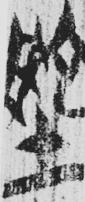地
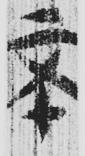不
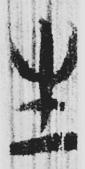生
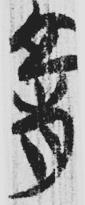○（孽）
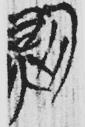則
